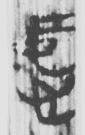忠
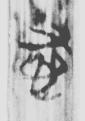{旡心}
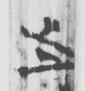之
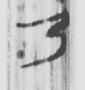乃
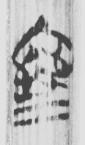{宀臸}
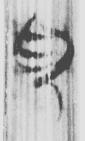色
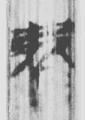弗
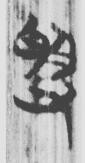受
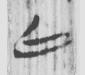㠯（以）
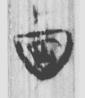固
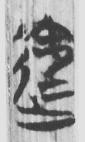御
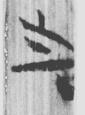之
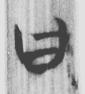曰
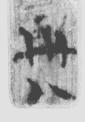{卅八}
